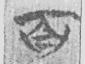百
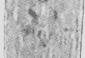廿
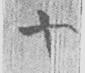七
